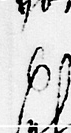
s¬
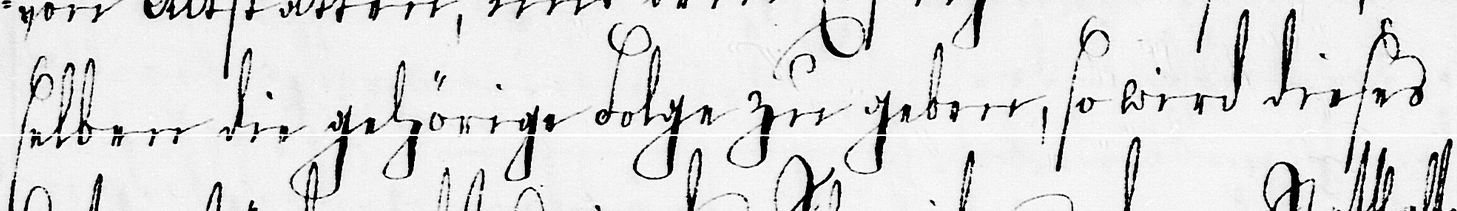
elben die gehörige Folge zu geben, so wird dieses
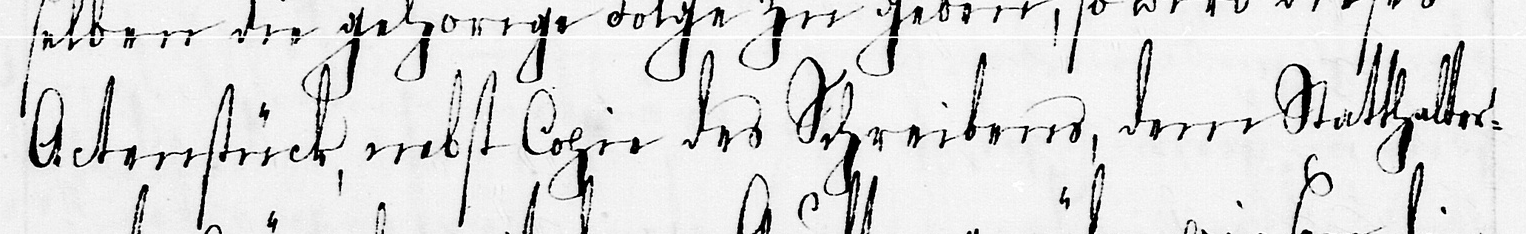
Actenstück, nebst Copie des Schreibens, dem Statthalte¬
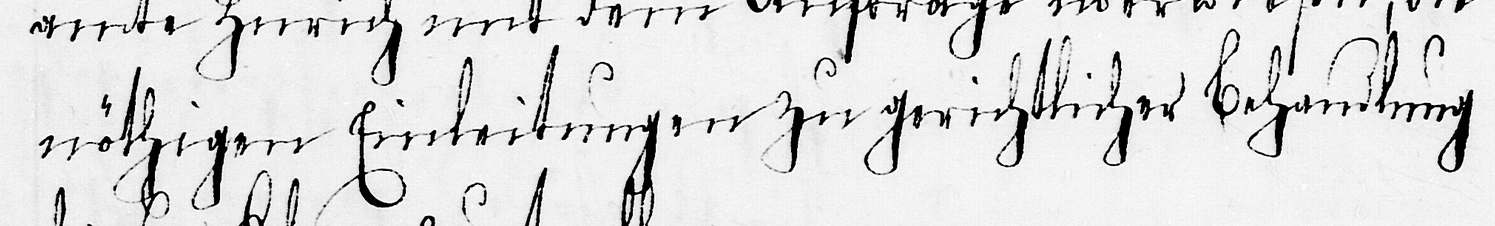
nöthigen Einleitungen zu gerichtlicher Behandlung
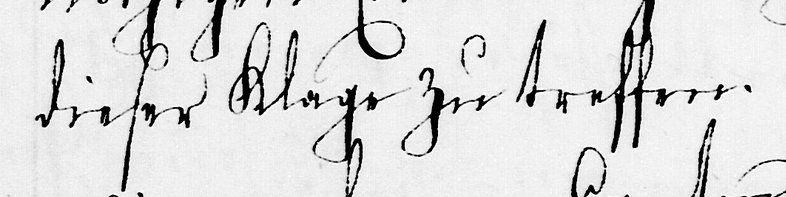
dieser Klage zu treffen.
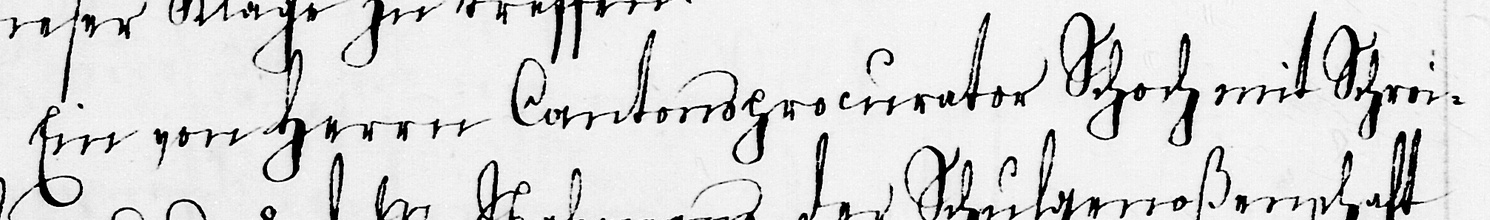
Ein von Herrn Cantonsprocurator Schoch mit Schrei¬
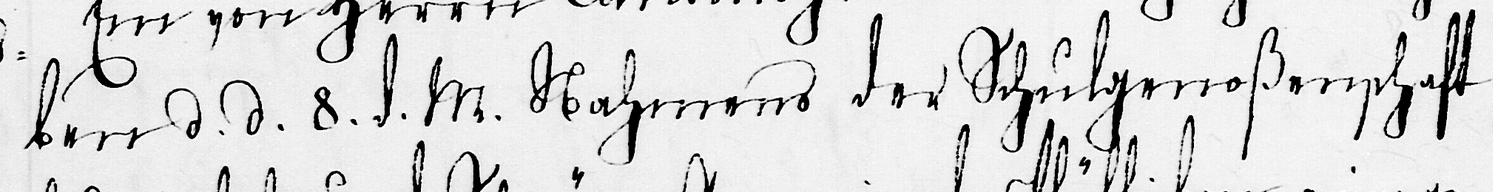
ben d. d. 8. d. M. Nahmens der Schulgenoßenschaft
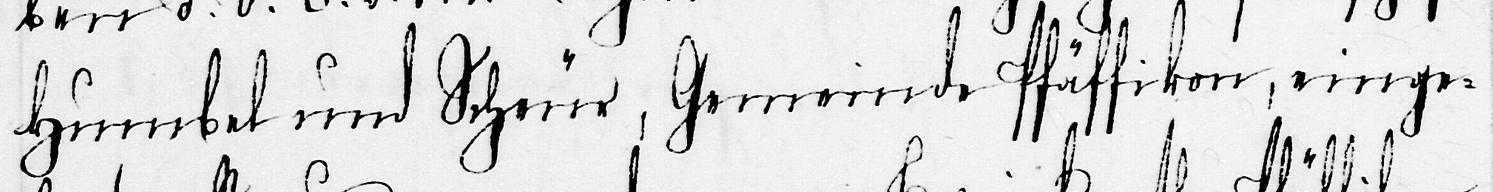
Humbel und Scheur, Gemeinde Pfäffikon, einge¬
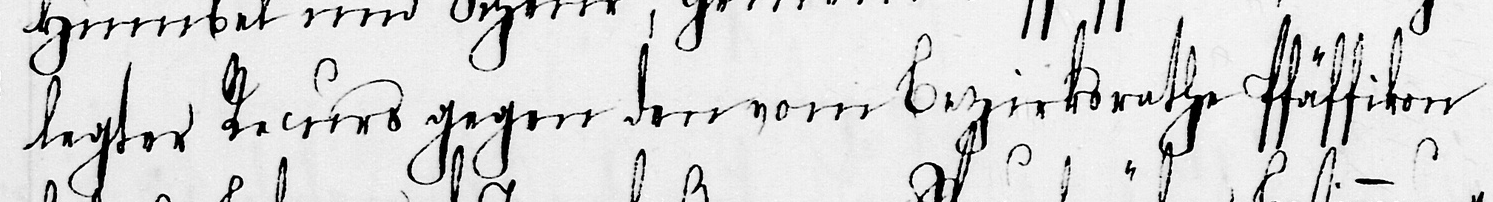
legter Recurs gegen den vom Bezirksrathe Pfäffikon
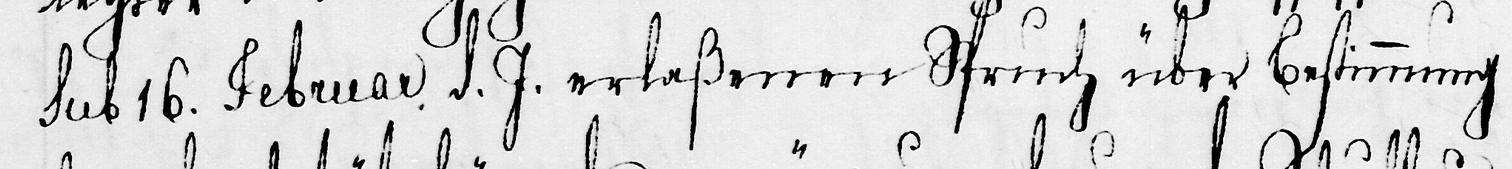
sub 16. Februar d. J. erlaßenen Spruch über Bestimmung
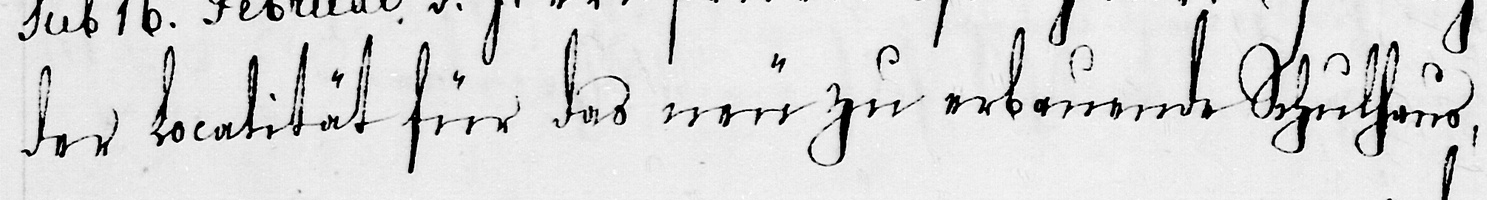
der Localität für das neu zu erbauende Schulhaus,
